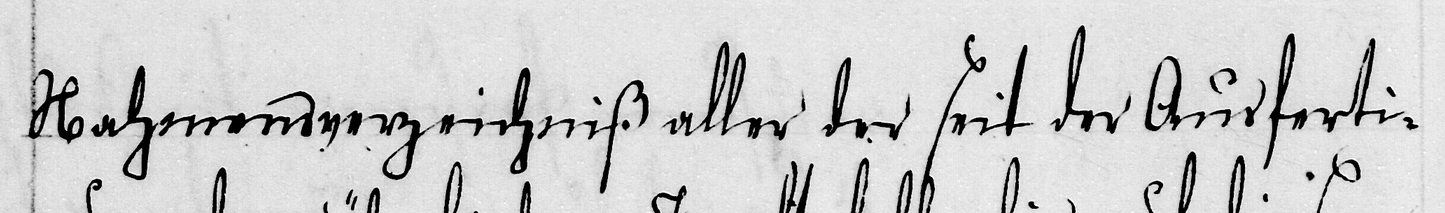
Nahmensverzeichniß aller der seit der Ausferti¬
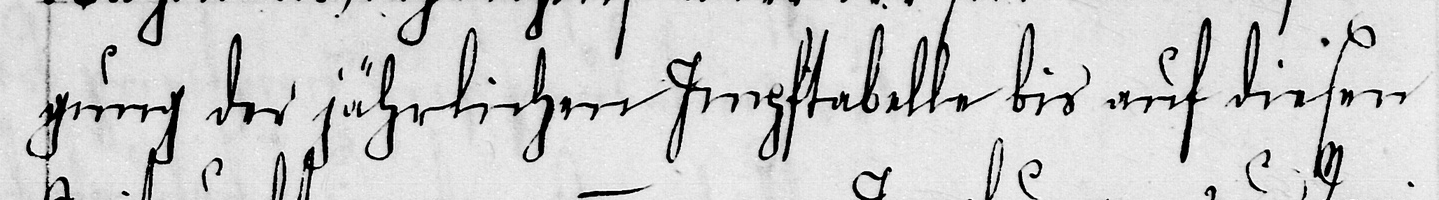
gung der jährlichen Impftabelle bis auf diesen
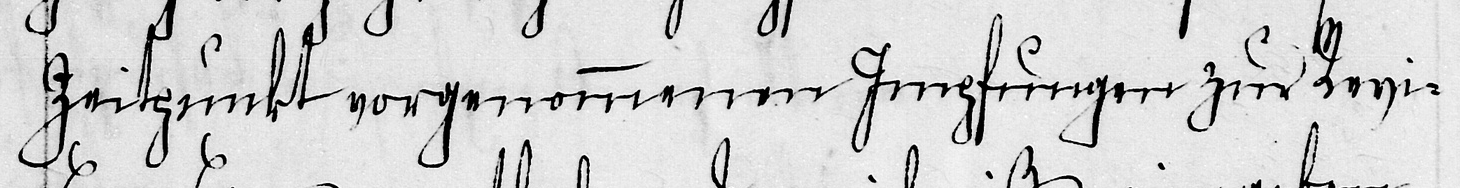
Zeitpunkt vorgenommenen Impfungen zur Revi¬
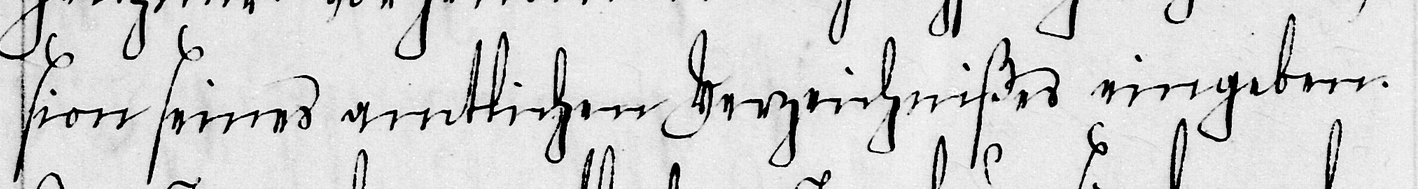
sion seines amtlichen Verzeichnißes eingeben.
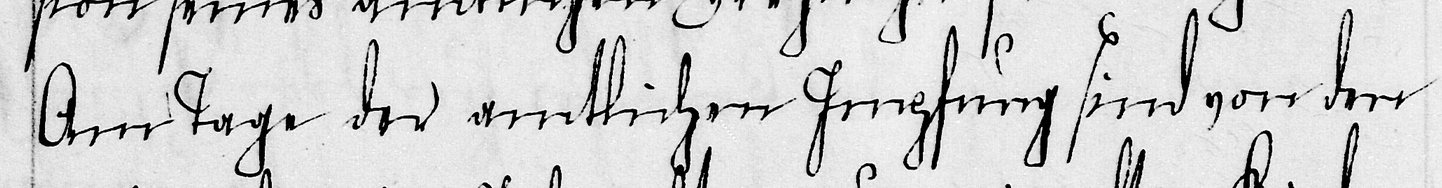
Am Tage der amtlichen Impfung sind von den
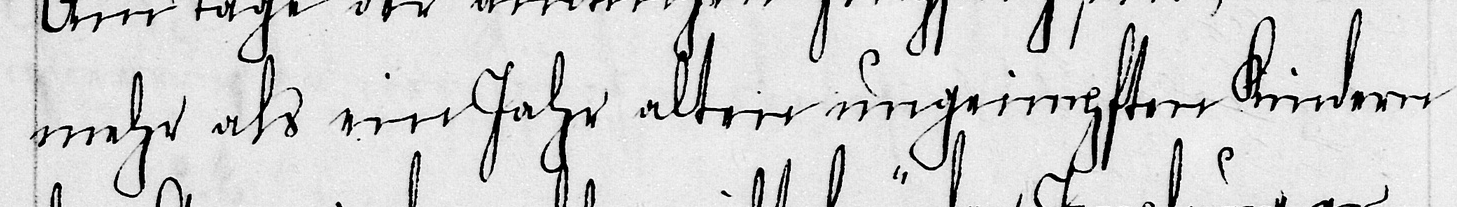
mehr als ein Jahr alten ungeimpften Kindern
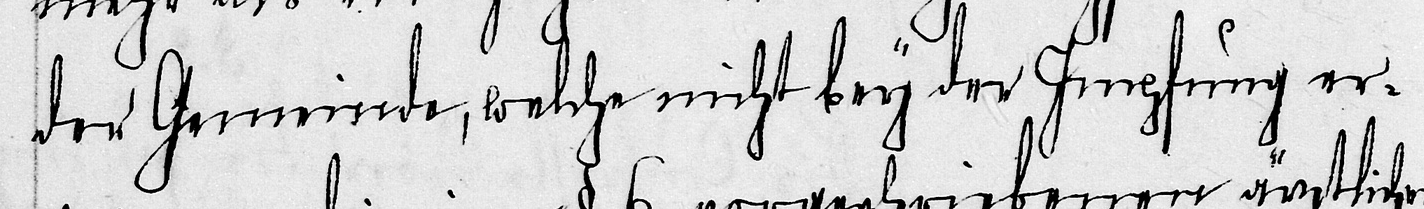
der Gemeinde, welche nicht bey der Impfung er¬
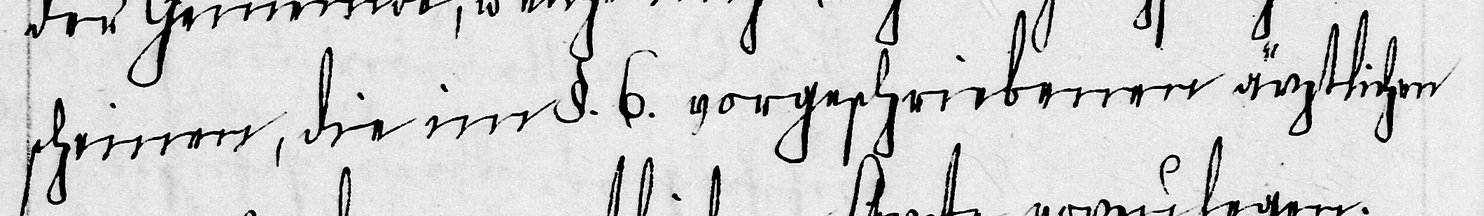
scheinen, die im §. 6. vorgeschriebenen ärztlichen
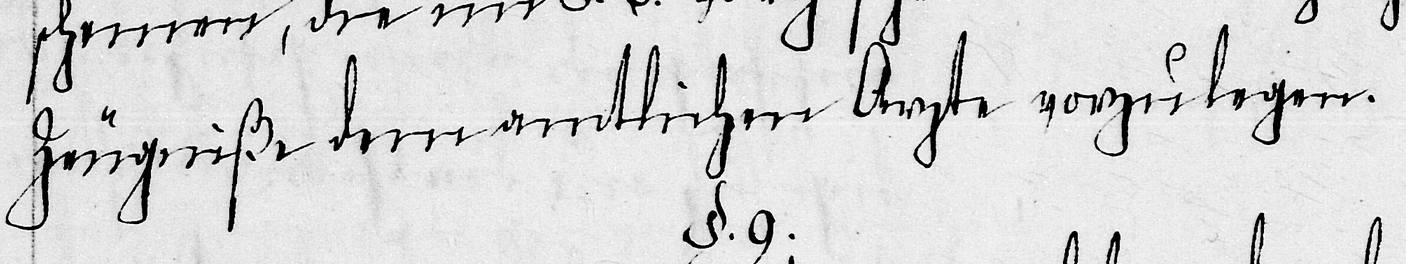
Zeugniße dem amtlichen Arzte vorzulegen.
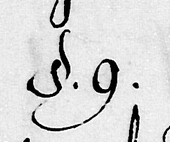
§. 9.
